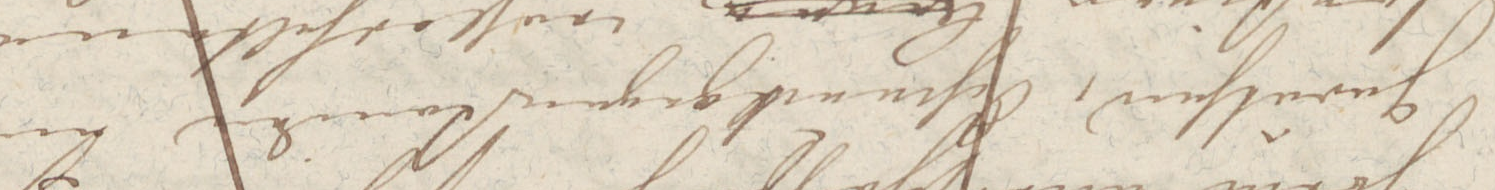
der Menschengeschichte als % Wahr-
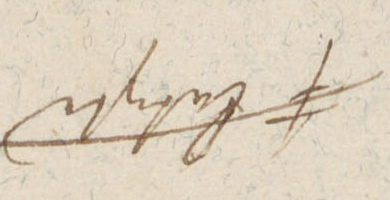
intimsten
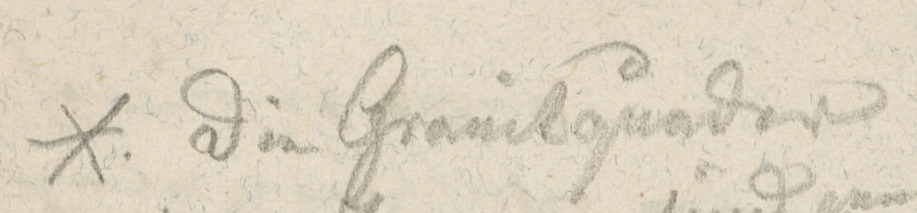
die Gebräuche und Neigungen
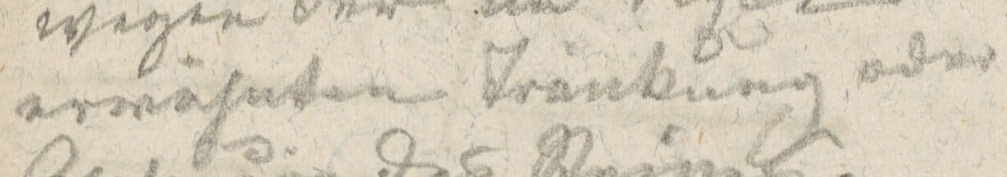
das wahre Wesen des Volkes der
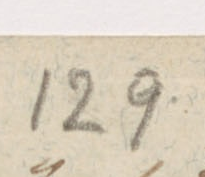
129
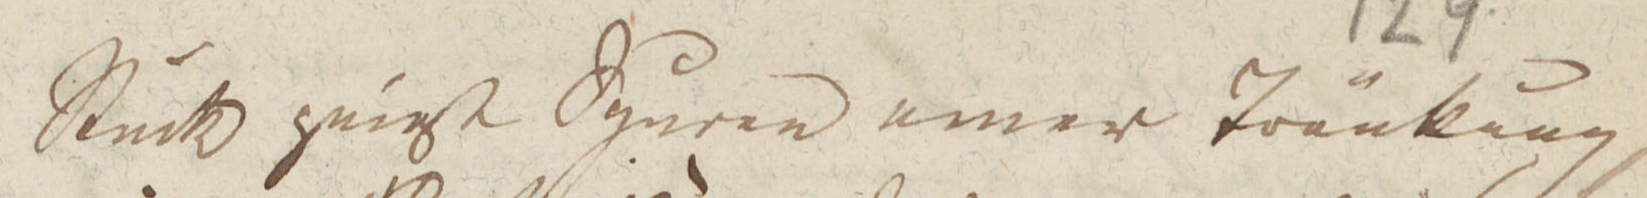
Stuck zeigt Spuren einer Tränkung,
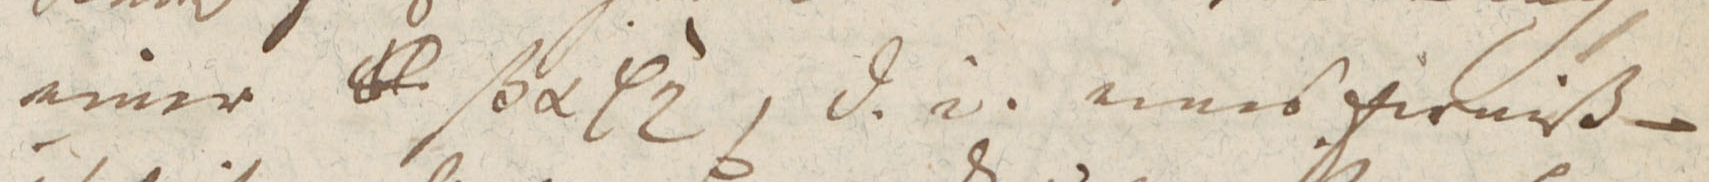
einer βαψὴ, d. i. eines firniss-
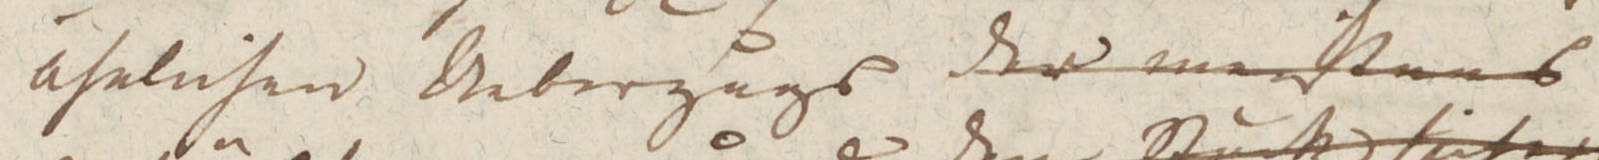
ähnlichen Ueberzugs der meistens
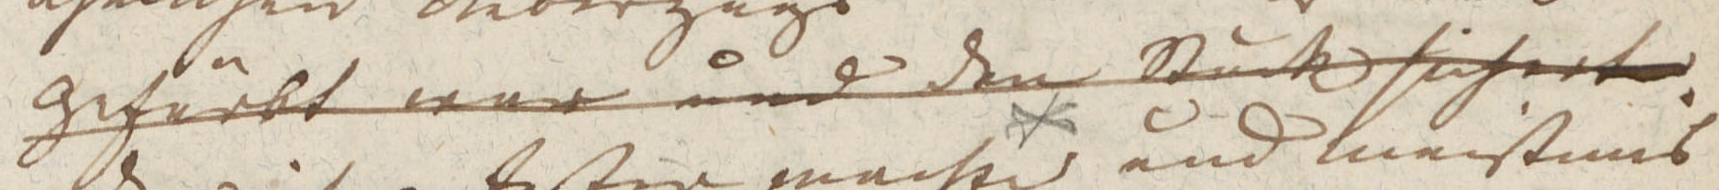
gefärbt war und den Stuck sicherte
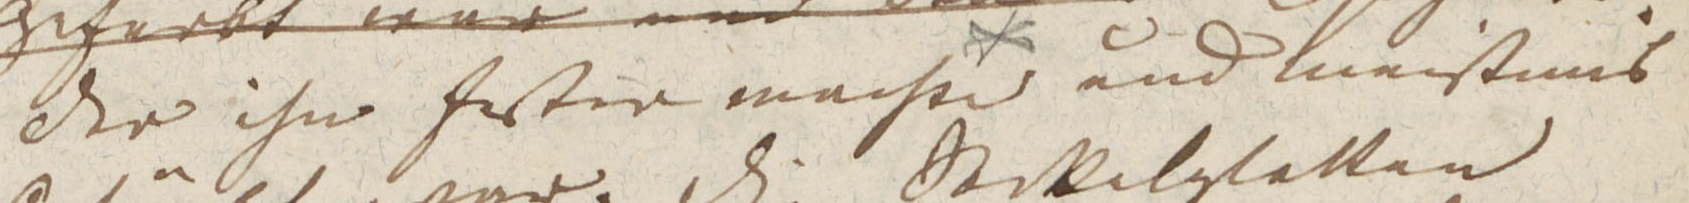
der ihn fester machte % und meistens
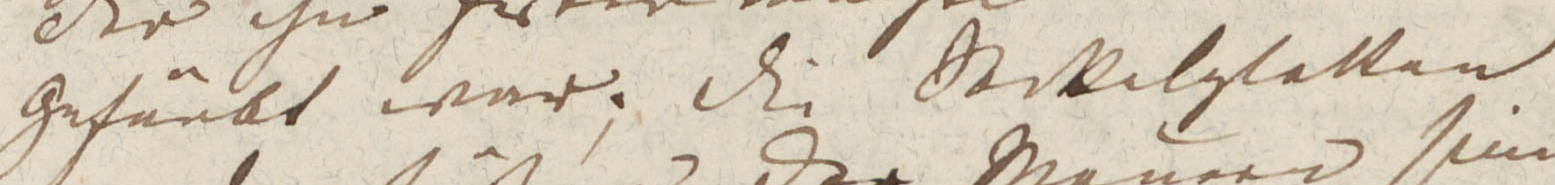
gefärbt war; Die Sockelplatten
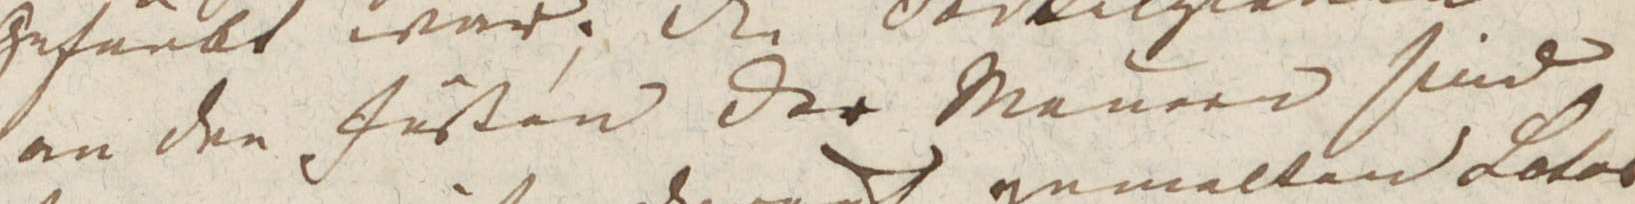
an den Füssen der Mauern sind
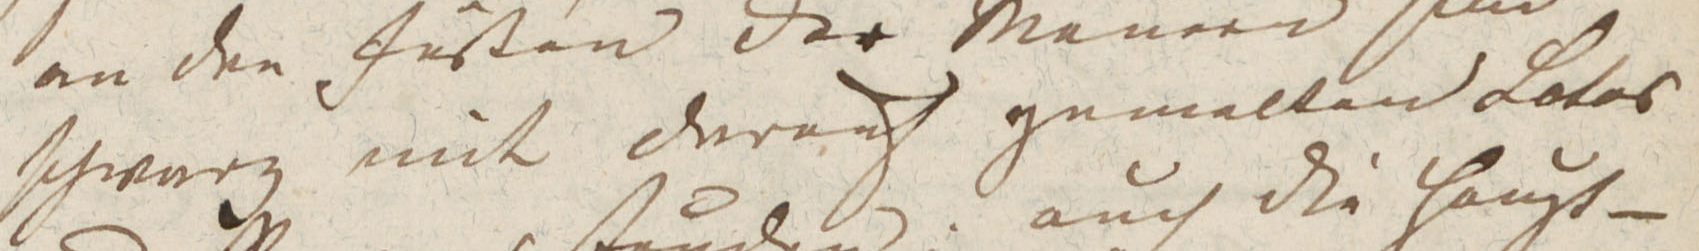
schwarz mit darauf gemalten Lotos
